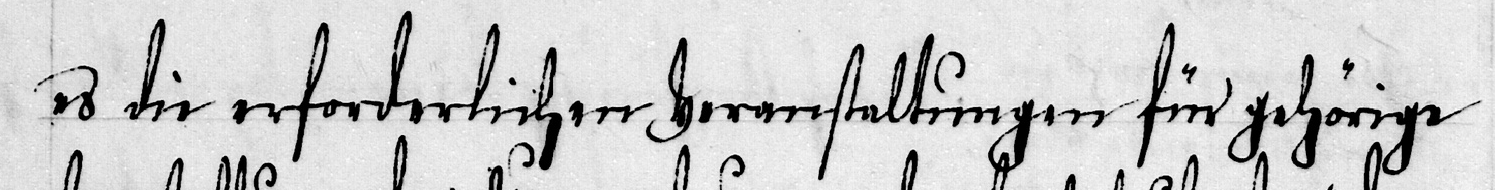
es die erforderlichen Veranstaltungen für gehörige
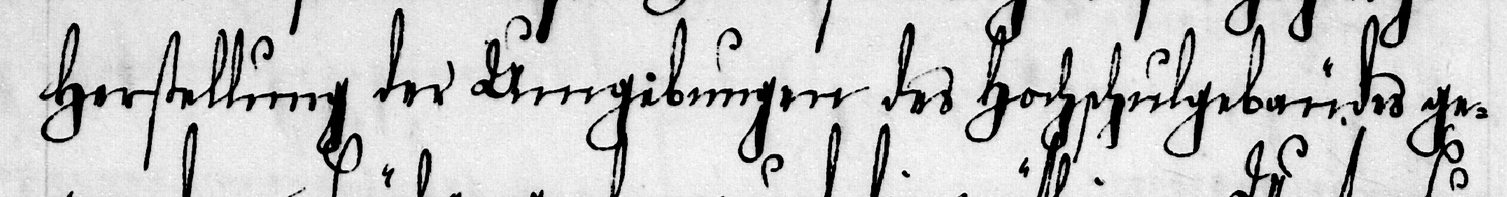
Herstellung der Umgebungen des Hochschulgebäudes ge¬
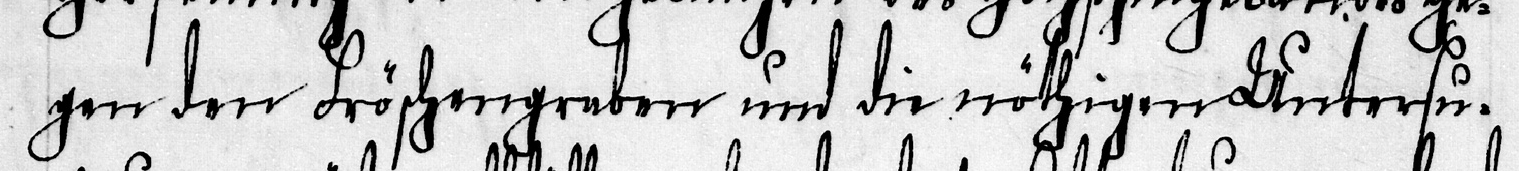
gen den Fröschengraben und die nöthigen Untersu¬
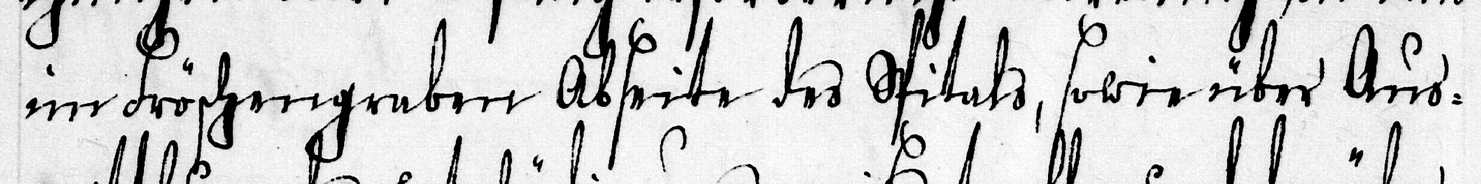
im Fröschengraben Abseite des Spitals, sowie über Aus¬
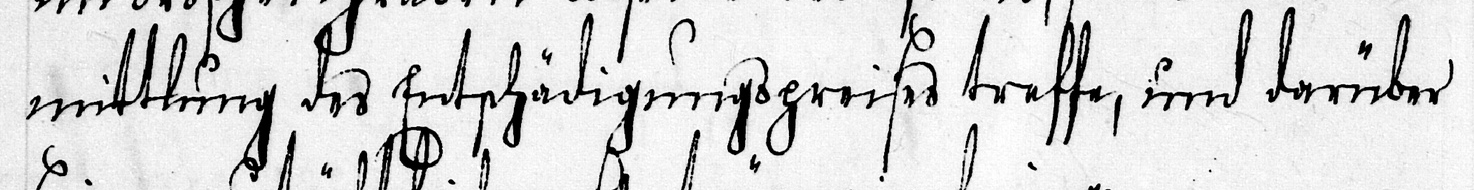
mittlung des Entschädigungspreises treffe, und darüber
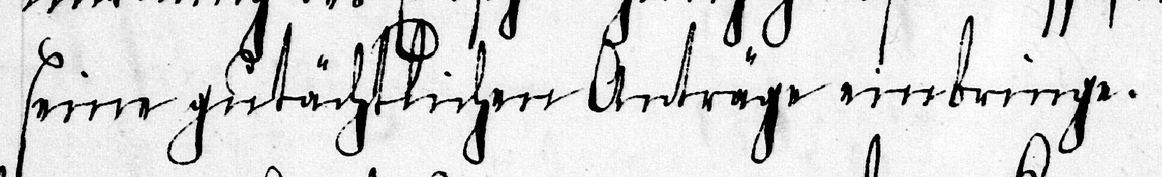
seine gutächtlichen Anträge einbringe.
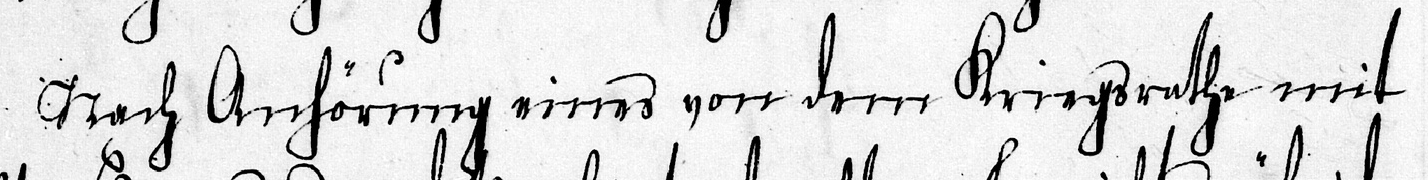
Nach Anhörung eines von dem Kriegsrathe mit
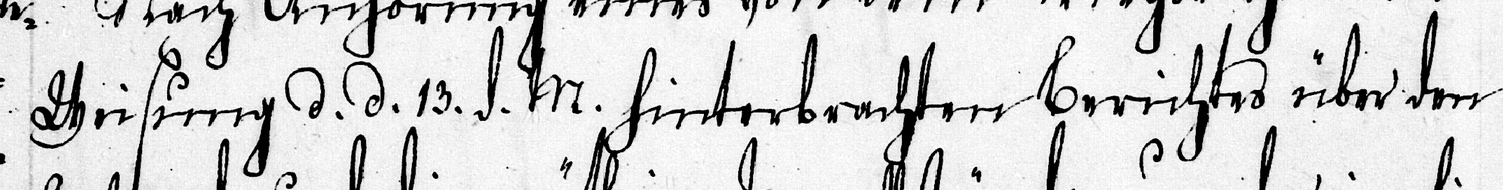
Weisung d. d. 13. d. M. hinterbrachten Berichtes über den
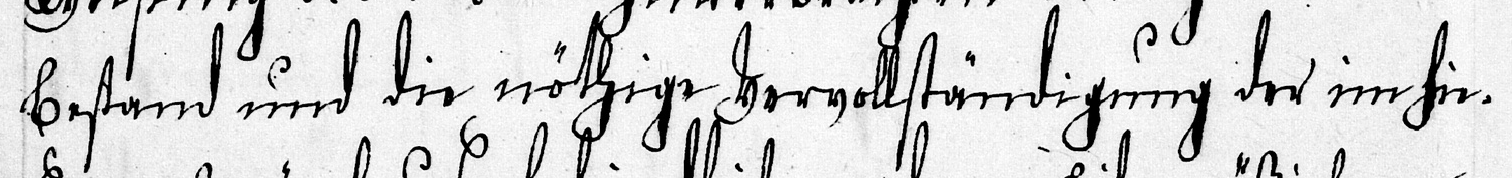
Bestand und die nöthige Vervollständigung der im hie¬
